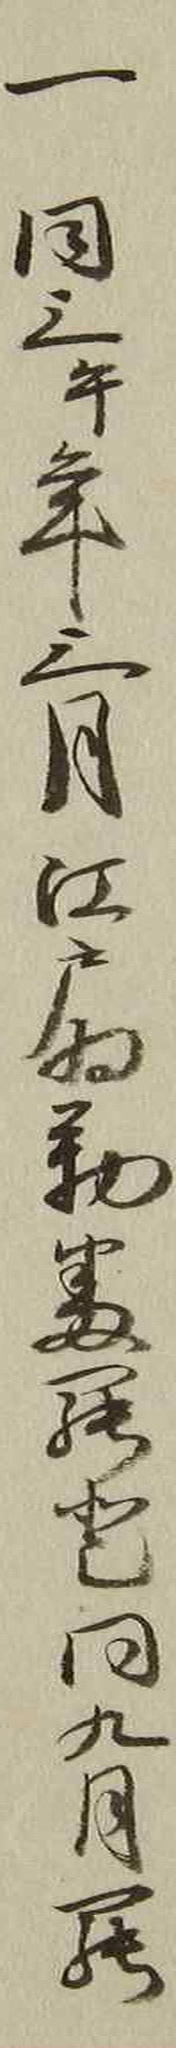一同三午年三月江戸為勤番罷登同九月罷
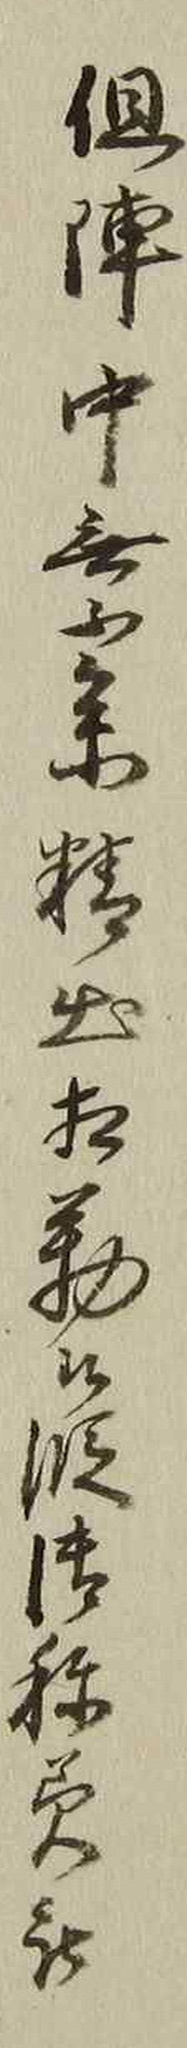但陣中無不参精出相勤候段御称美被
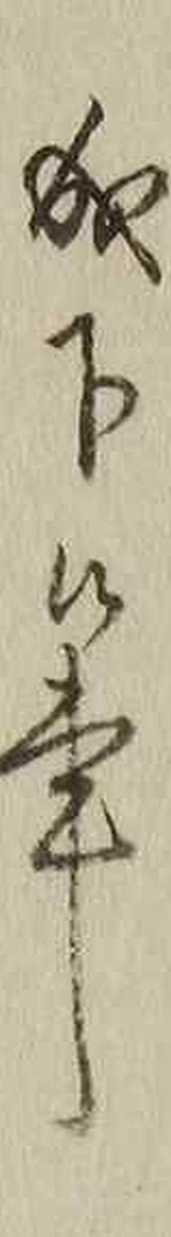成下候事
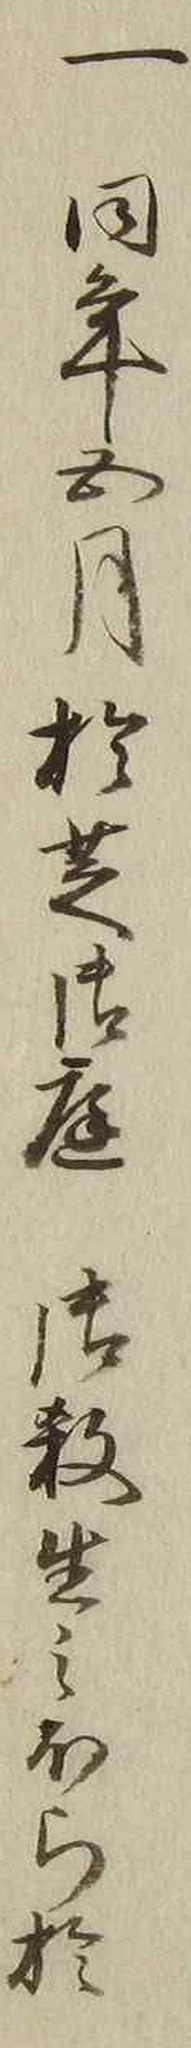一同年五月於芝御庭御殺生之ほら於
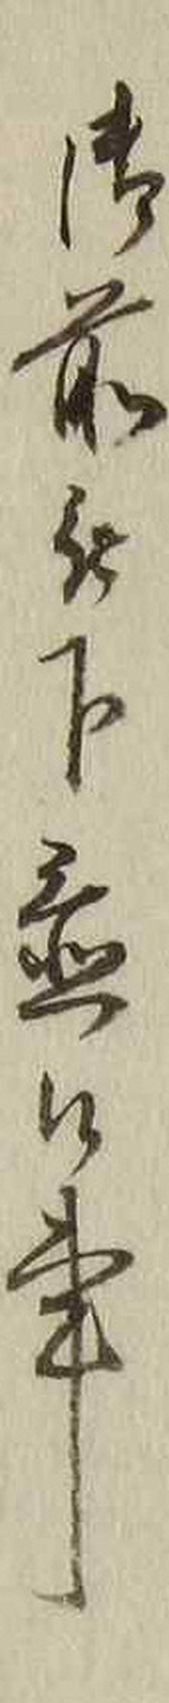御前被下置候事
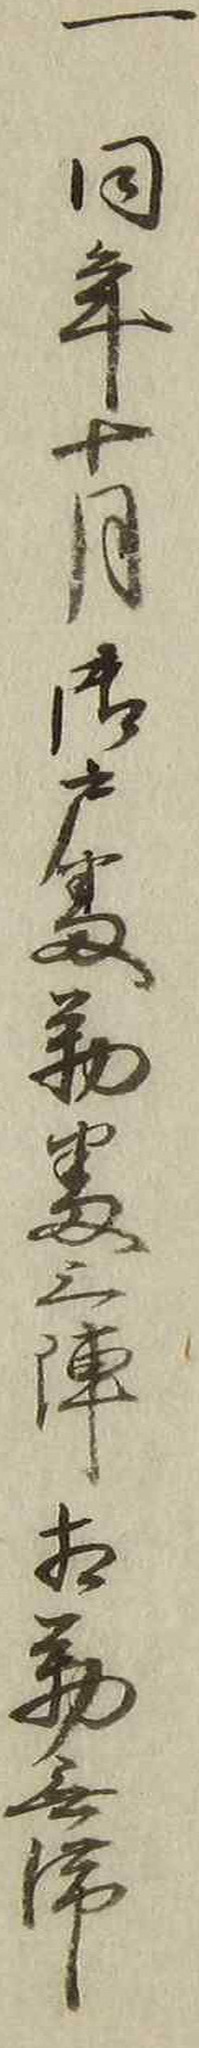一同年十月御戸番勤番三陣相勤無滞
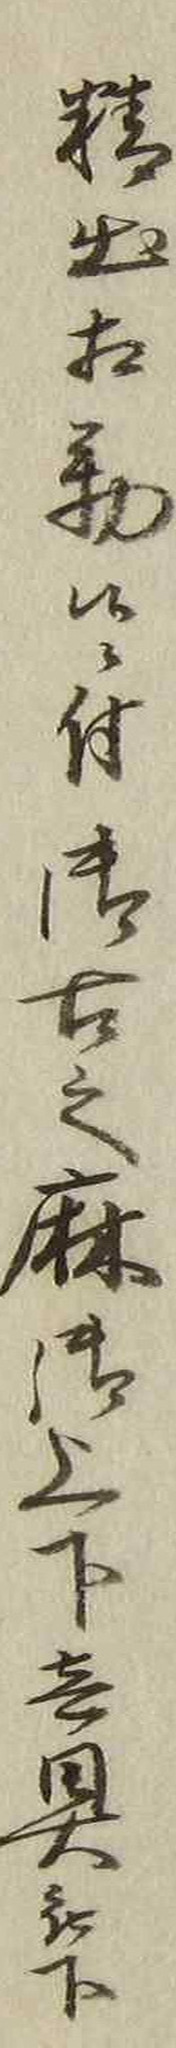精出相勤候ニ付御古之麻御上下壱具被下
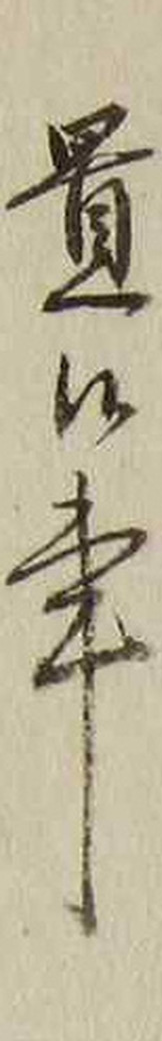置候事
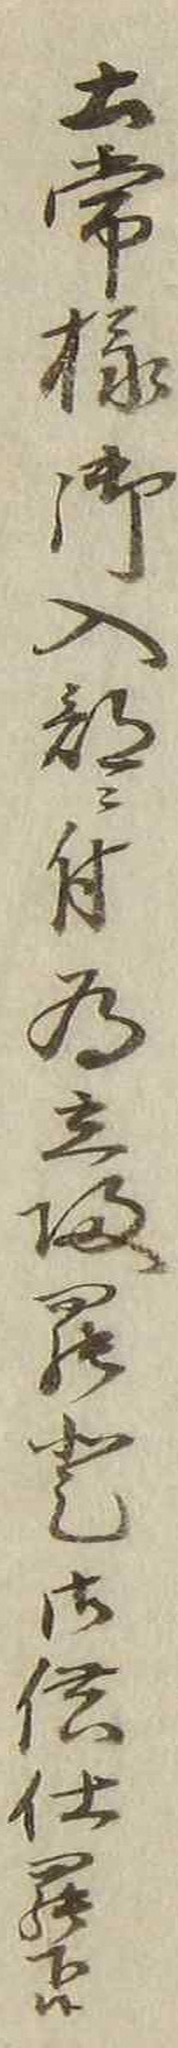土常様入部ニ付為立帰罷登御供仕罷下候
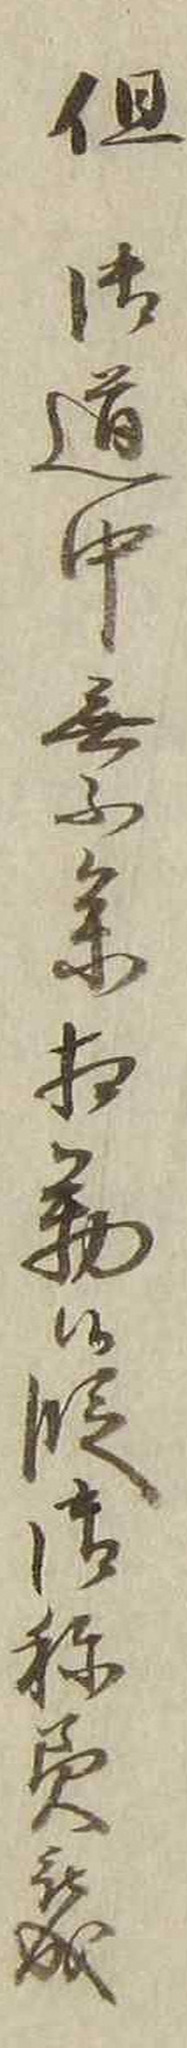但御道中無不参相勤候段御称美被成

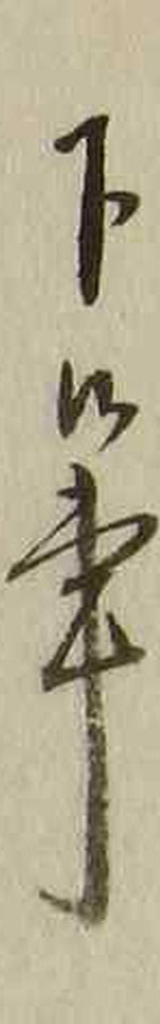下候事
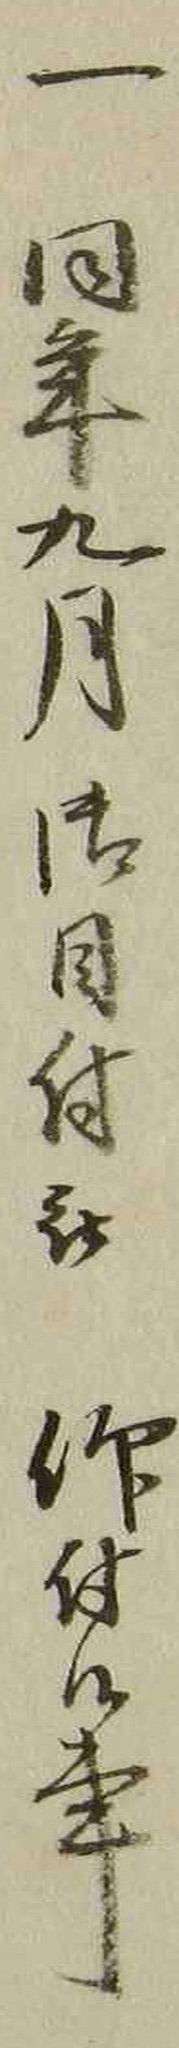一同年九月御目付被仰付候事
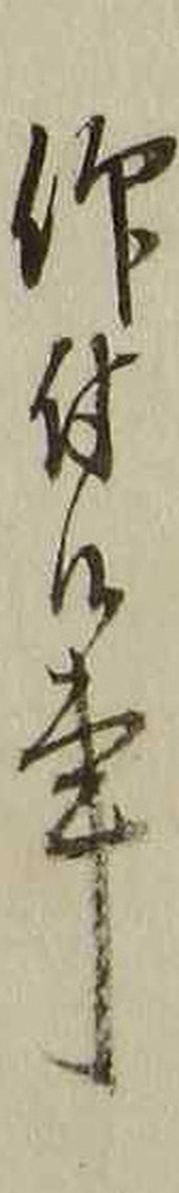仰付候事
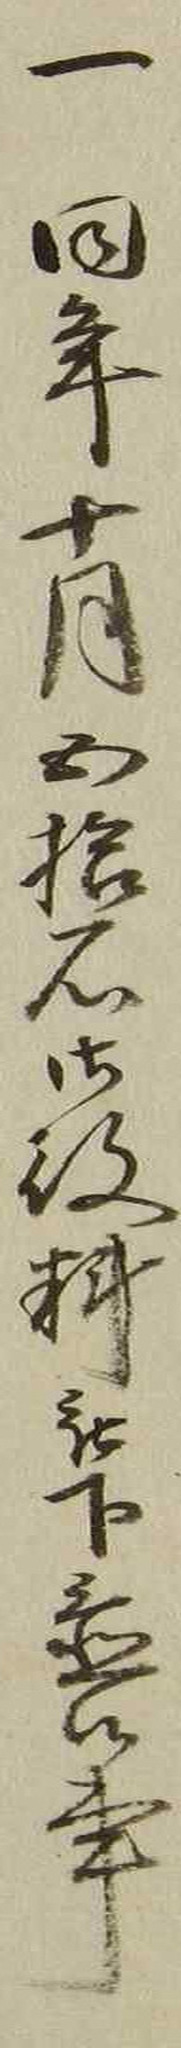一同年十月五拾石御役料被下置候事
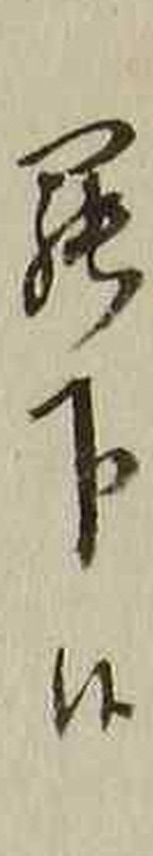罷下候
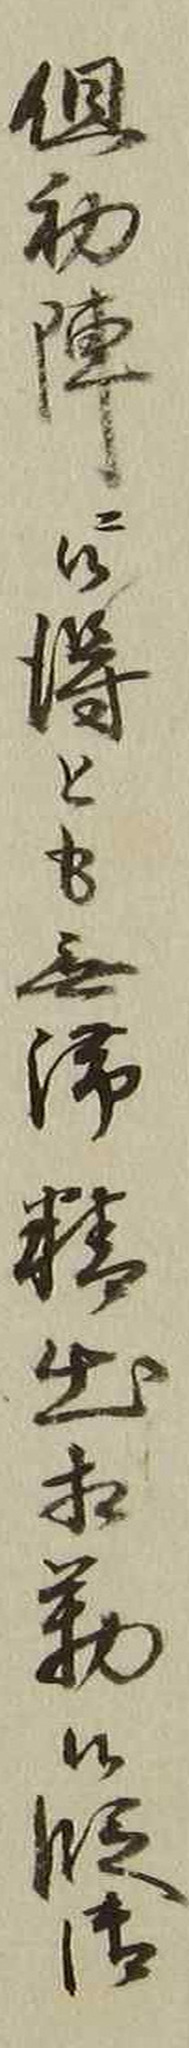但初陣ニ候得とも無滞精出相勤候段御
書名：諸士系譜　巻之128　た之部4
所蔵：会津若松市立会津図書館
